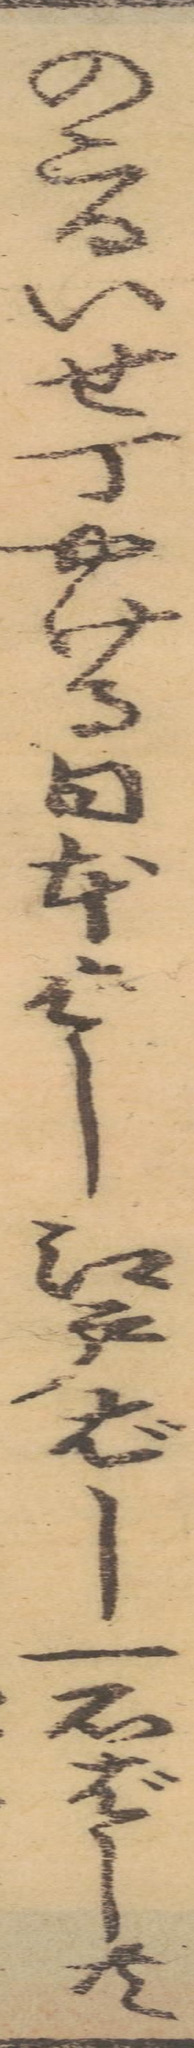のこるいせ丁やける日本ばし江戸ばし一石ばし共
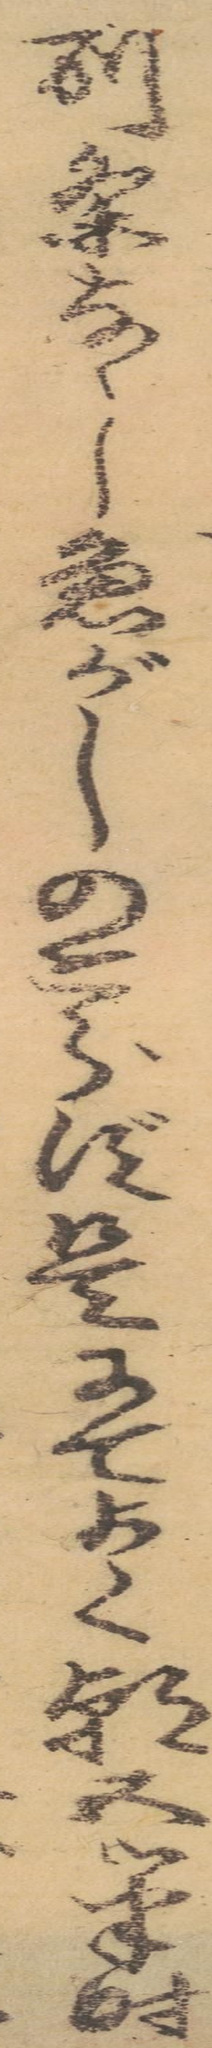別条なし魚がしのこらず是にてよく朝五ッ半時
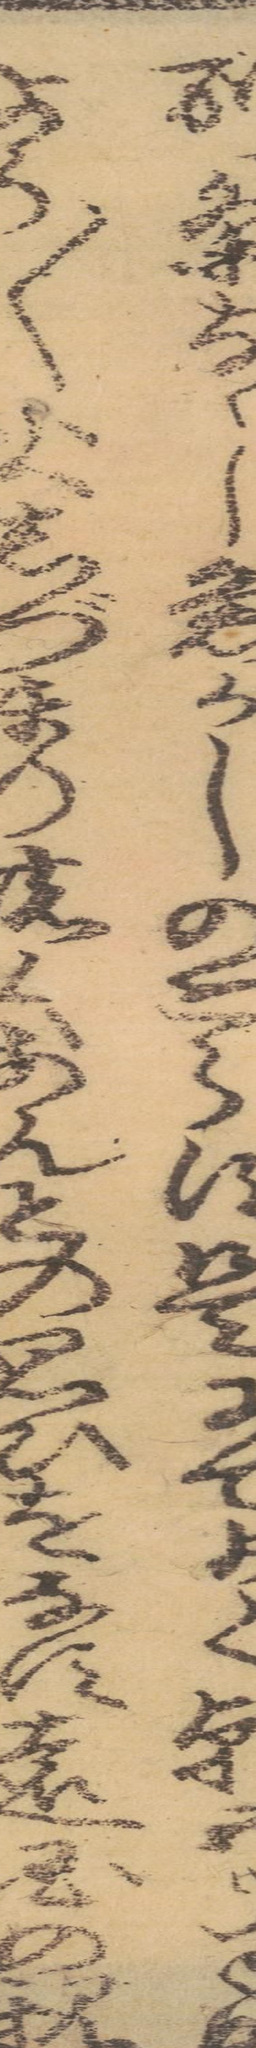よう〳〵火しづまり諸人あんどの思ひをなす遠国の親
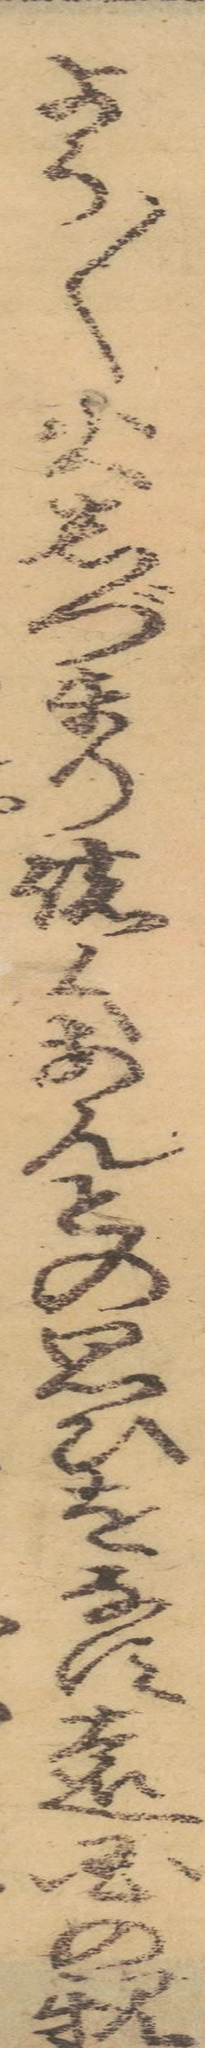よう〳〵火しづまり諸人あんどの思ひをなす遠国の親
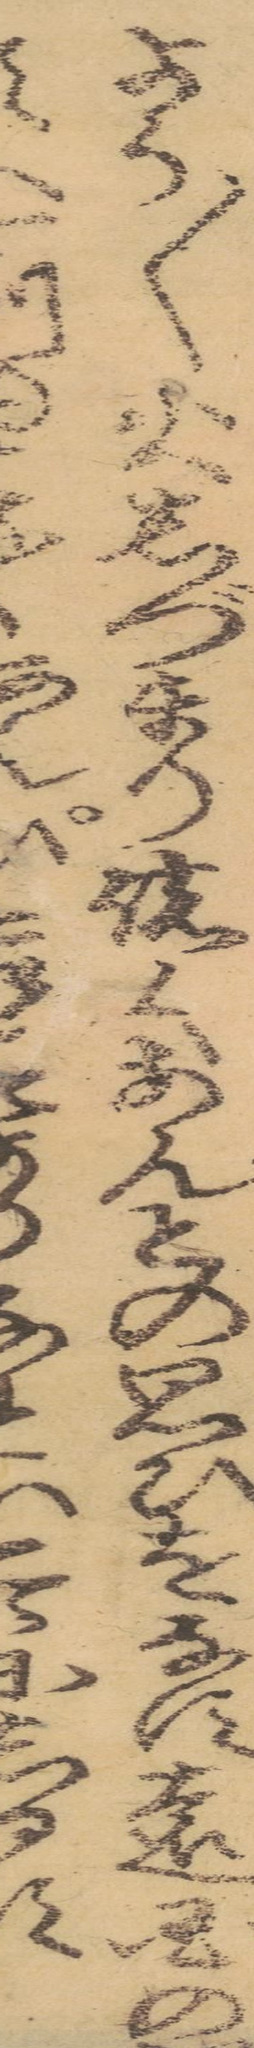よう〳〵火しづまり諸人あんどの思ひをなす遠国の親
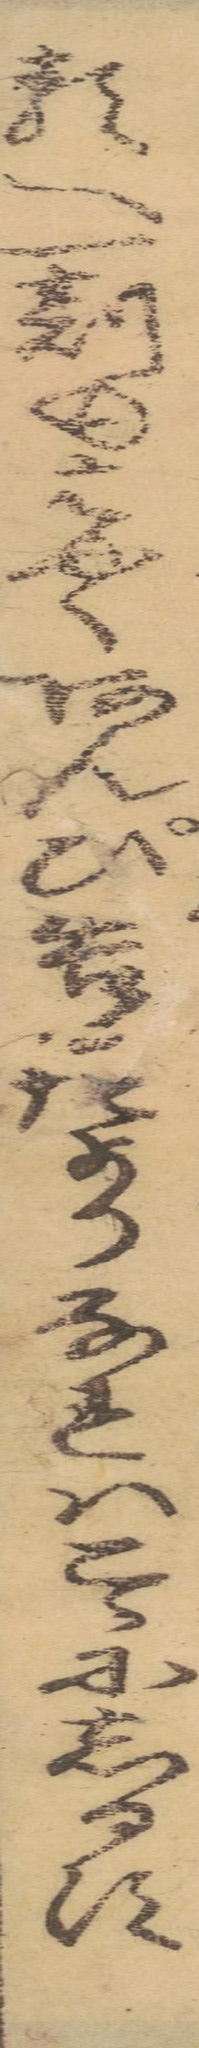類へ一刻もはやくあんぴ告たよりなれはこゝにしるす
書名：[安政元年十二月の江戸大火に関する瓦版]
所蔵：東京大学地震研究所図書室 Earthquake Research Institute Library, The University of Tokyo, JAPAN
